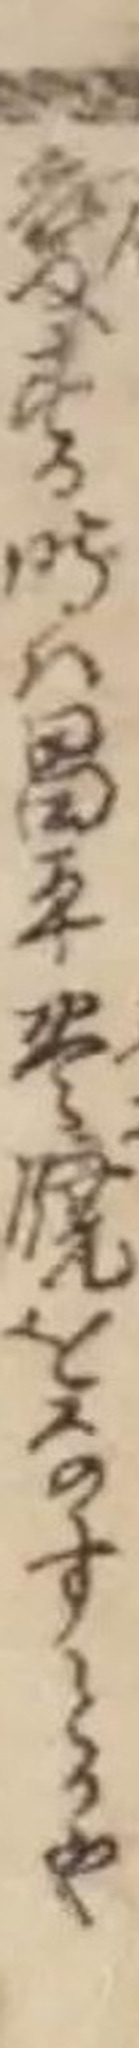変する時は昌平豊饒をなすとかや
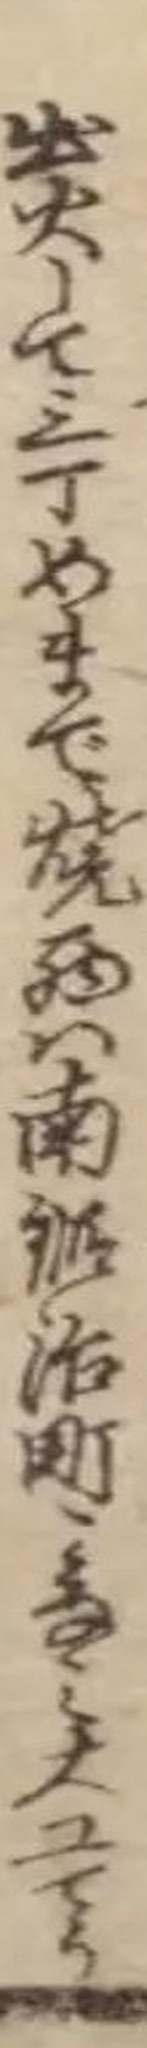出火して三丁目まで焼西は南鍛治町みなみ大工てう
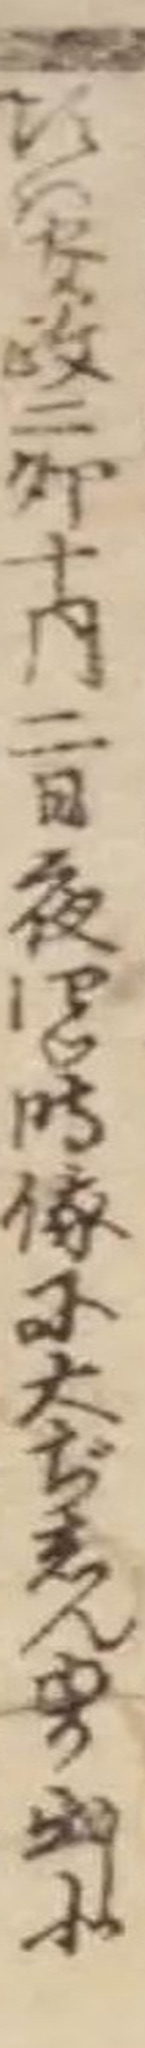頃は安政二卯十月二日夜四つ時俄に大ぢしんゆり出し北
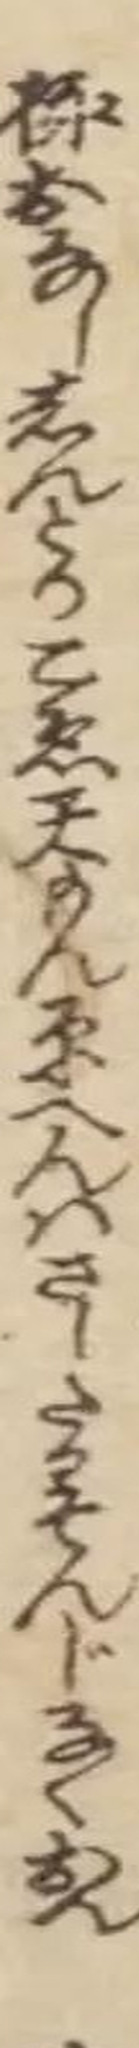様おなししんとりこゑ天もん原へんはさしたるそんじなくおん
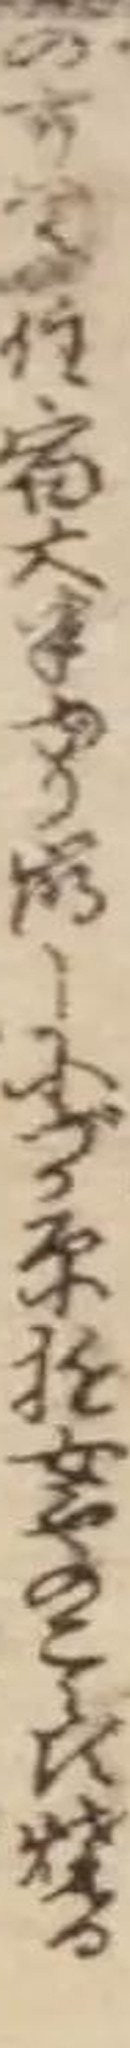の方千住宿大半ゆり崩し小づか原遊女やのこらず焼る
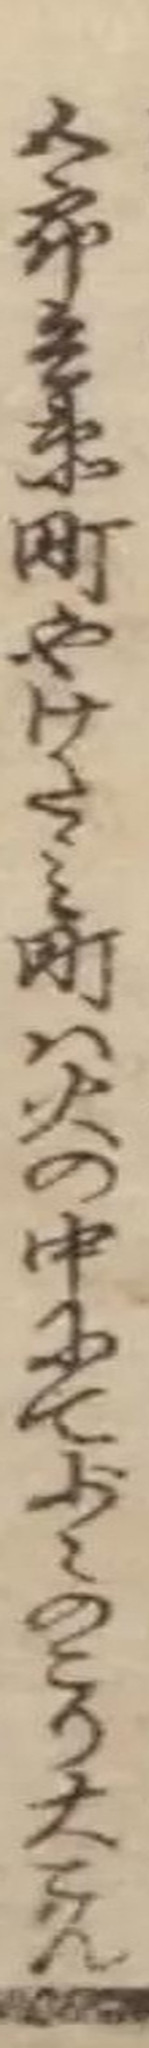五郎兵衛町やけたみ町は火の中にて少々のこり大こん
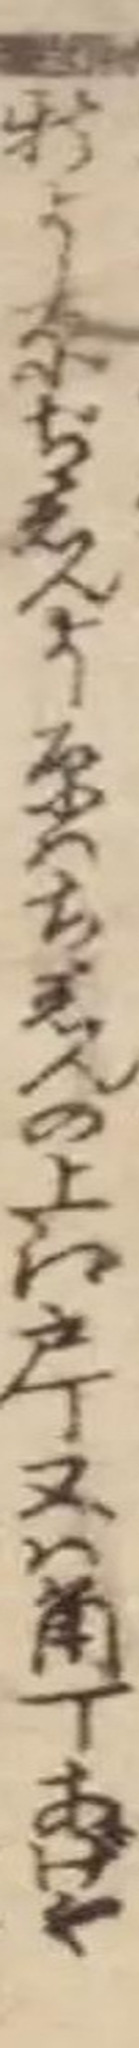新よし原ぢしんよし原はちしんの上江戸丁又は角丁あげや
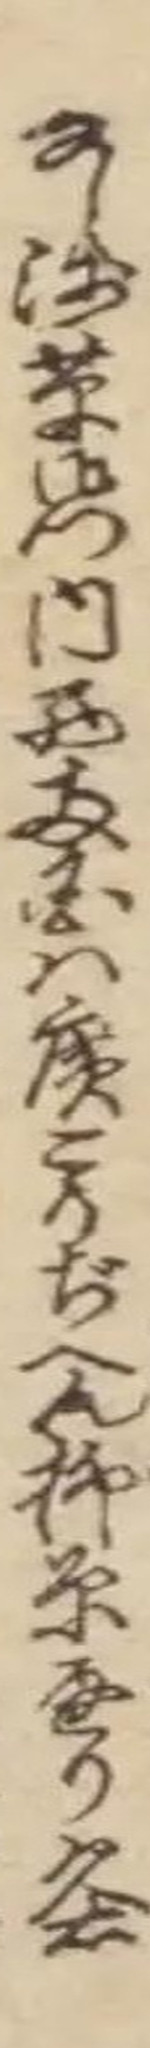なし浅草御門内西両国は広こうぢへん柳原通り久右
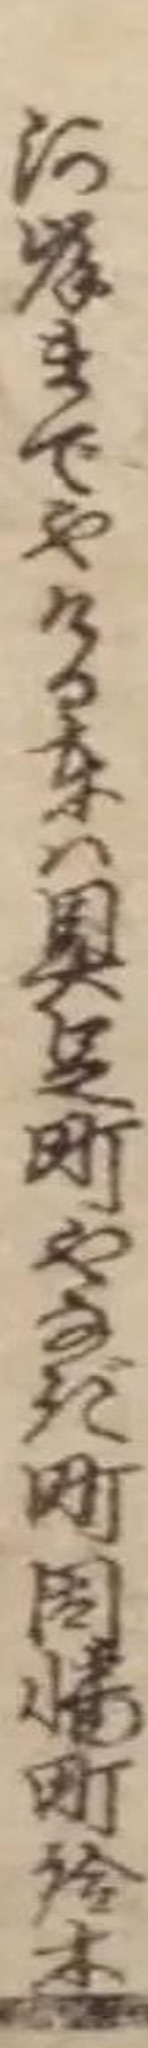河岸までやける東は具足町やなぎ町因幡町鈴木
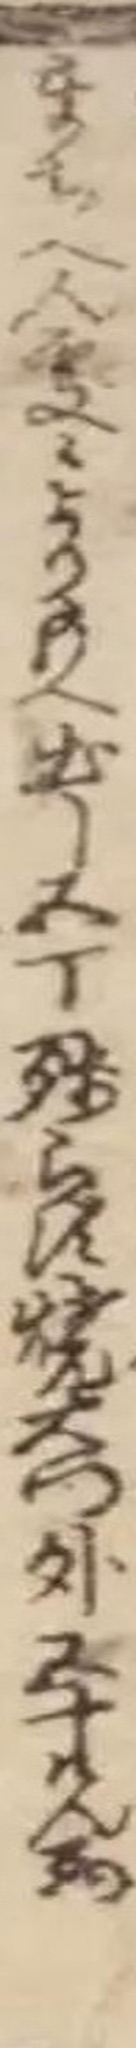まちへん処々よりもへ出し五丁残らず焼大門外五十けん西
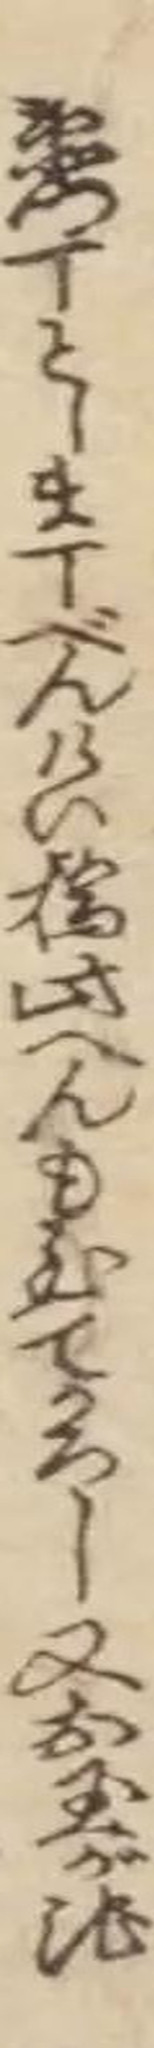衛門丁としま丁べんけい橋此へんも至てかろし又お玉が池
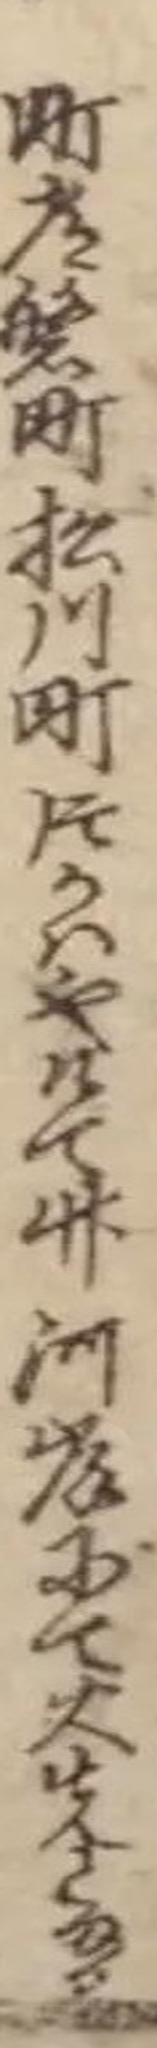町常盤町松川町片かはやけて廿洲常にて火先わまる
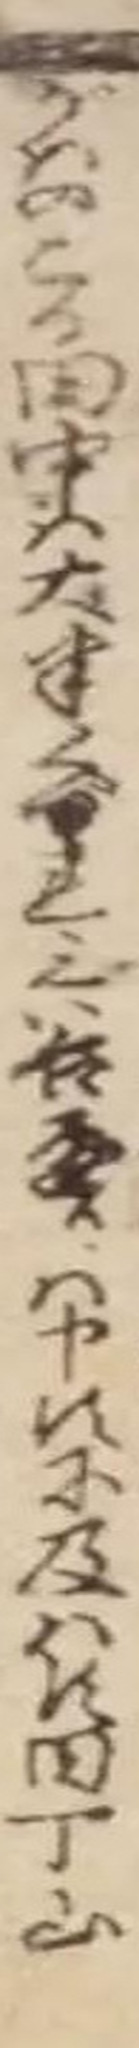がはのこる田中は大半くずれ三谷通りは申すに及はす田丁山
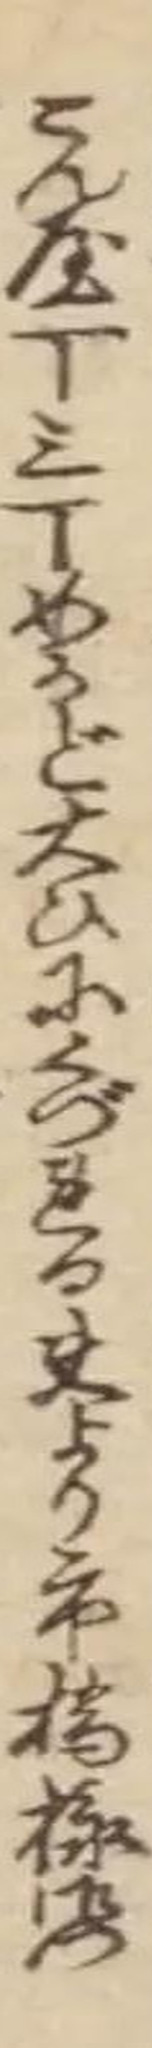こん屋丁三丁めかど大ひにくづれる夫より市橋様御門
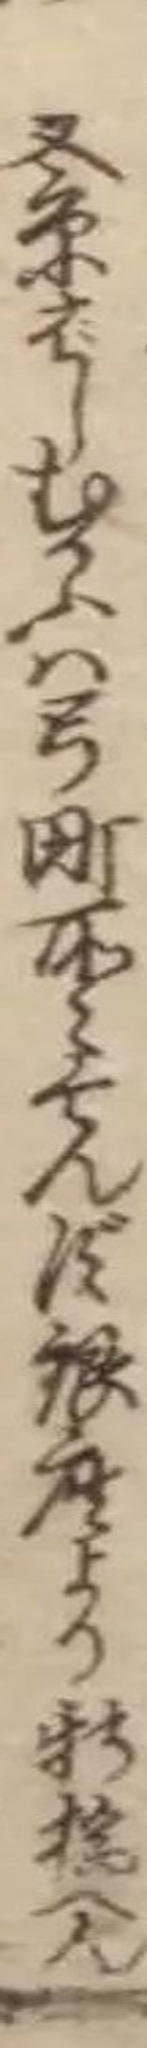又原はしむかふは弓町所々そんず銀座より新橋へん
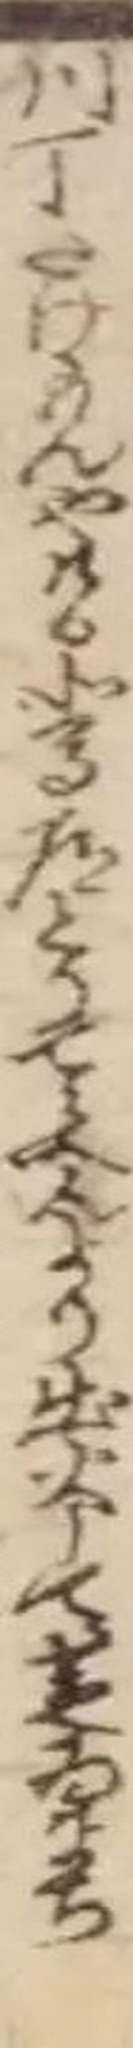川丁たけもんやける北馬道とりてうへんより出火して芝居まち
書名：関東大地震末代鑑
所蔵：国立国会図書館 National Diet Library, JAPAN
